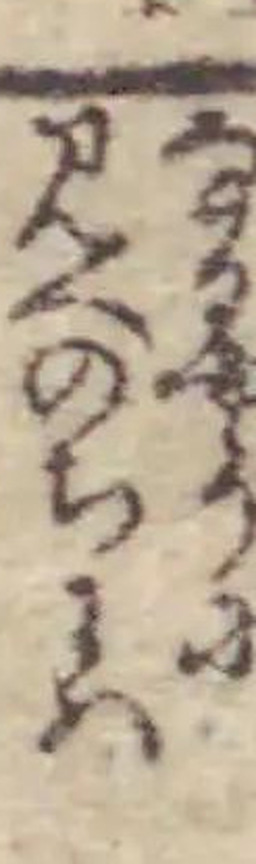見へのちには
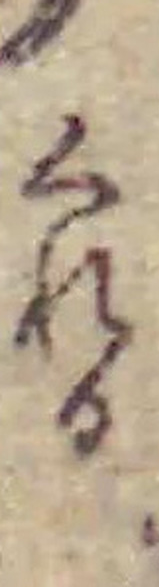くれる
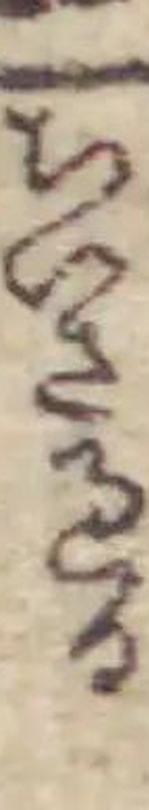ちいさ過る

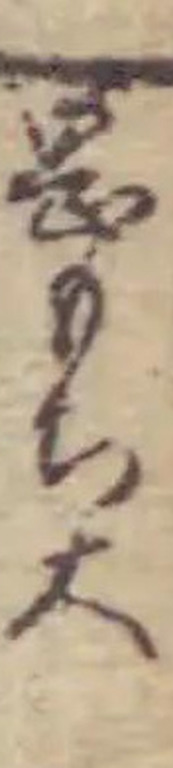岡もち大
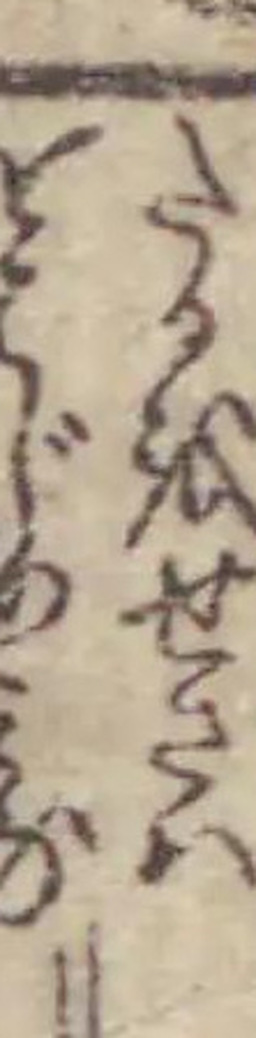をはじめみな
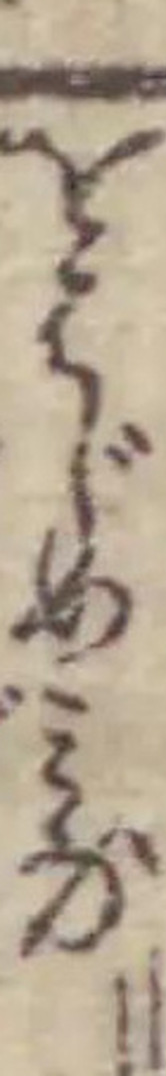をはじめみな
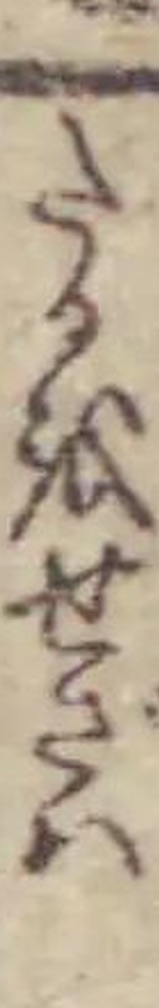たるをせざは
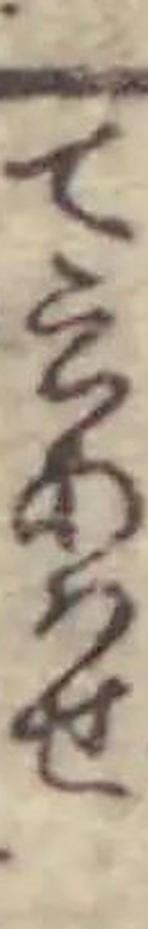て言あはせ
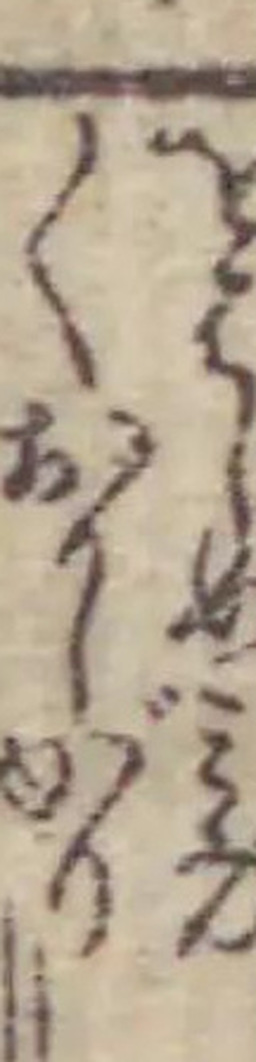〳〵おかしがり
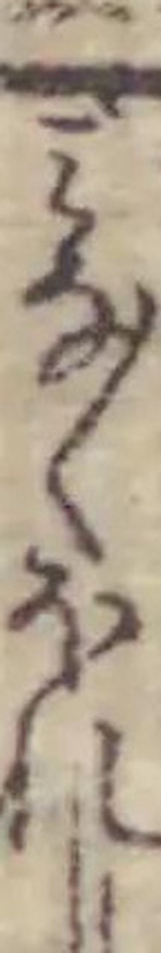みな〳〵ほれ
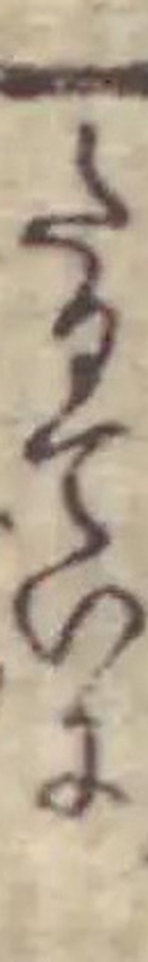たるていに
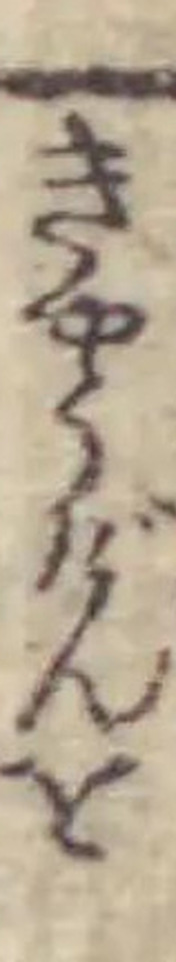きやうげんを
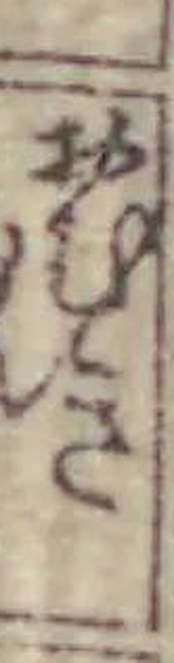おむき
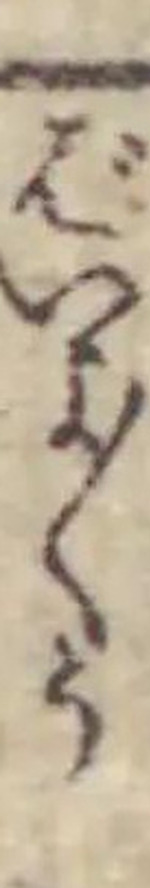ばいよ〳〵う
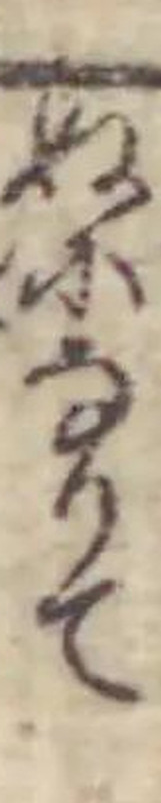ぬになりて
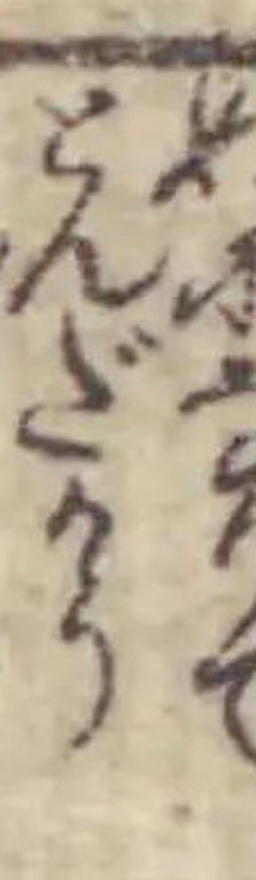とんだかう
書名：亀山人家妖 3巻
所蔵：国立国会図書館 National Diet Library, JAPAN
